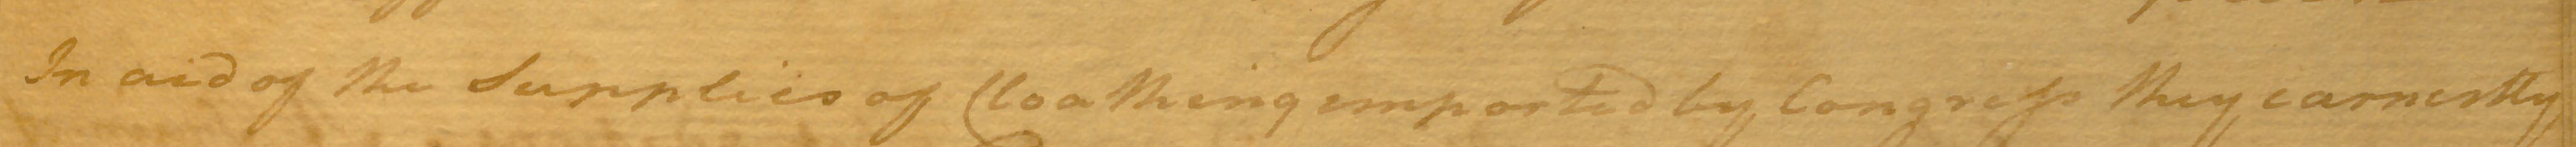In aid of the Supplies of Cloathing imported by Congress they earnestly
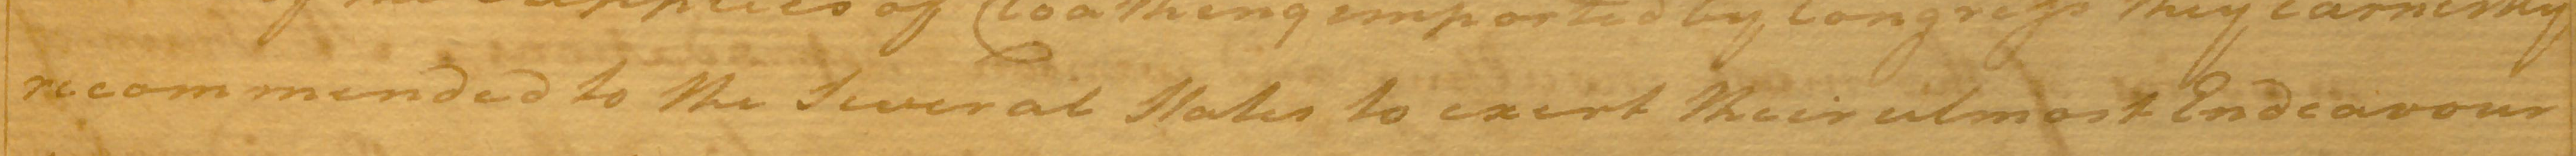recommended to the several states to exert their utmost Endeavour
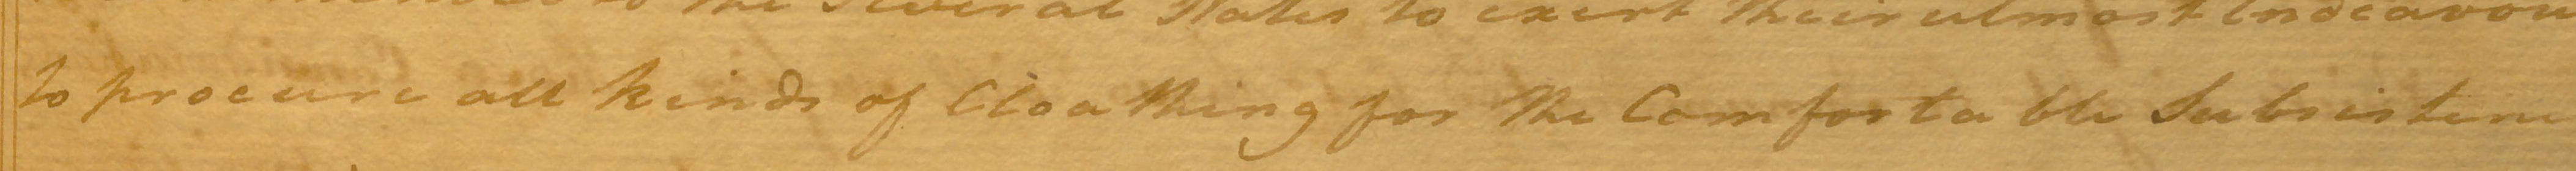to procure all kinds of Cloathing for the Comfortable Subsistence
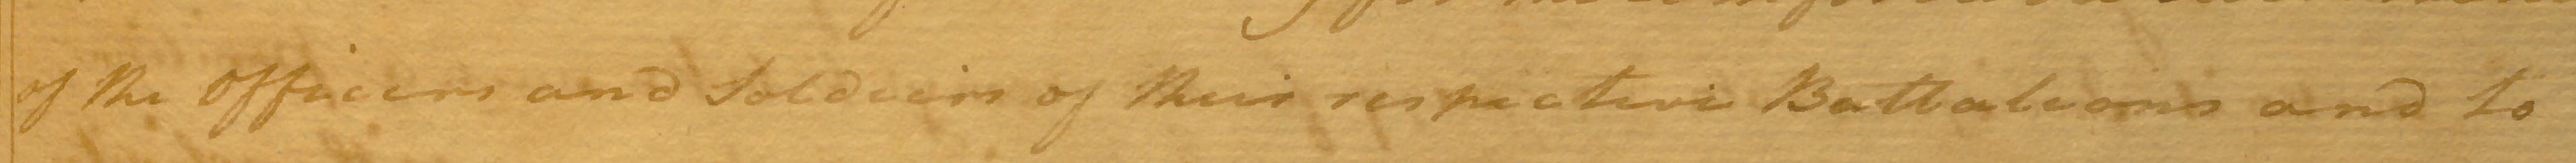of the Officers and Soldiers of their respective Battalions and to
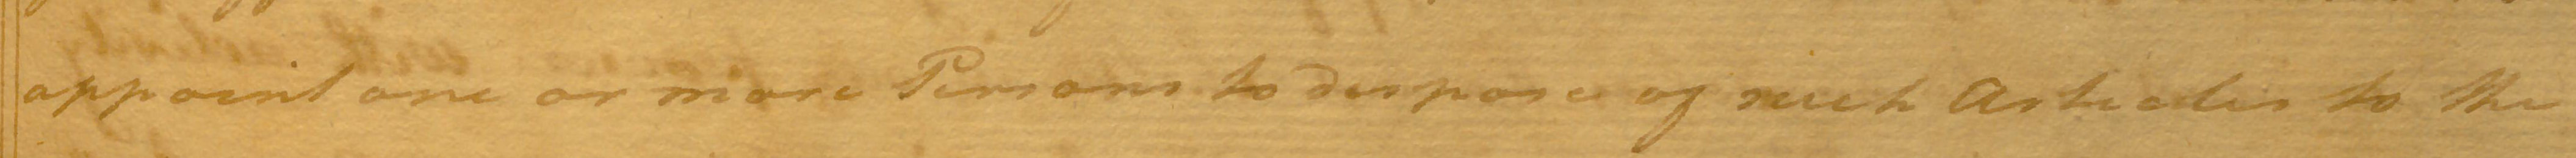appoint one or more Persons to dispose of such Articles to the
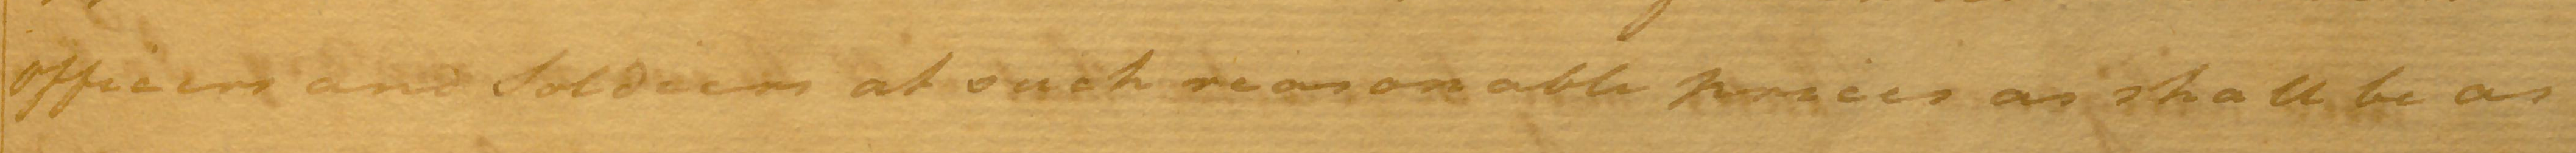officers and soldiers at such reasonable prices as shall be as
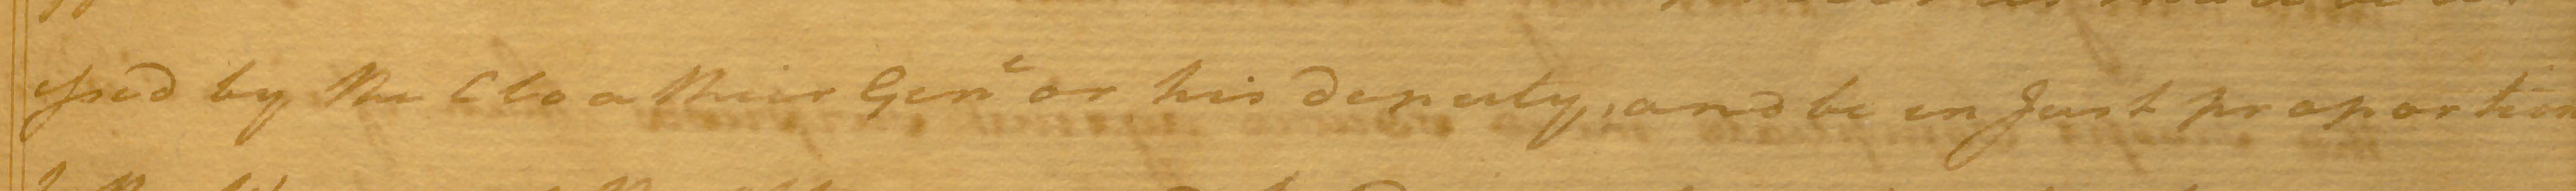essed by the Cloathier Gen^l or his deputy, and be in Just proportion
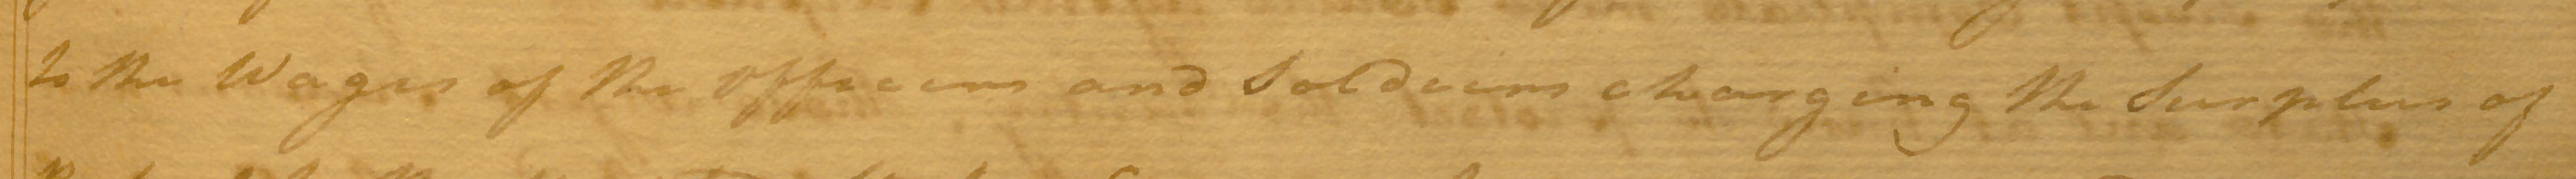to the Wages of the officers and soldiers charging the surplus of
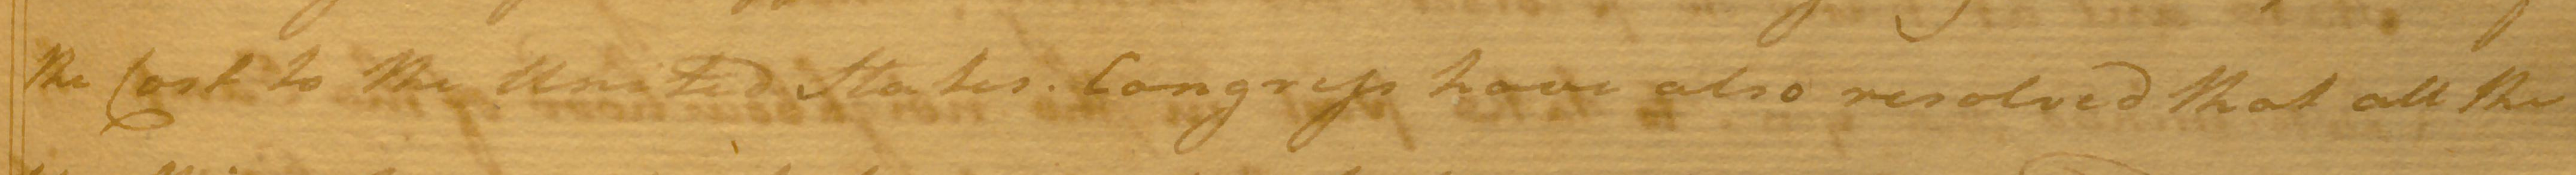the Cost to the united States. Congress have also resolved that all the
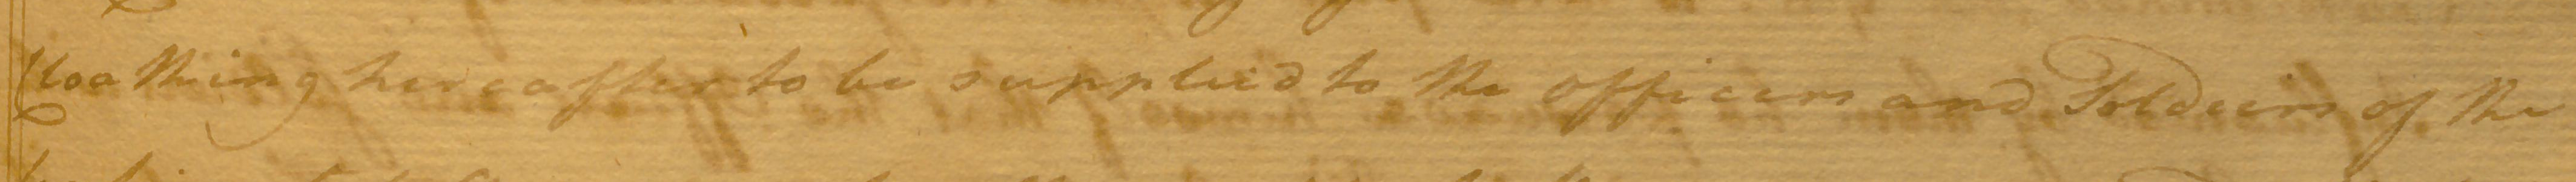Cloathing here after to be supplied to the officers and soldiers of the
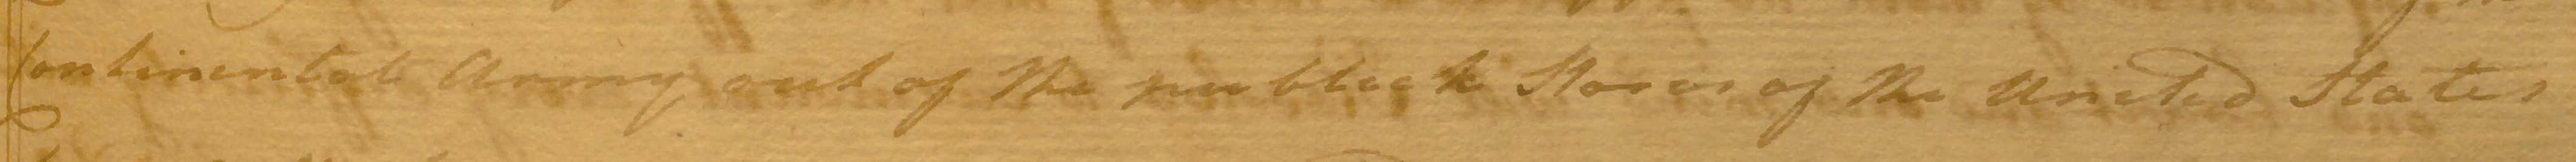Continental Army out of the publick Stores of the United States
